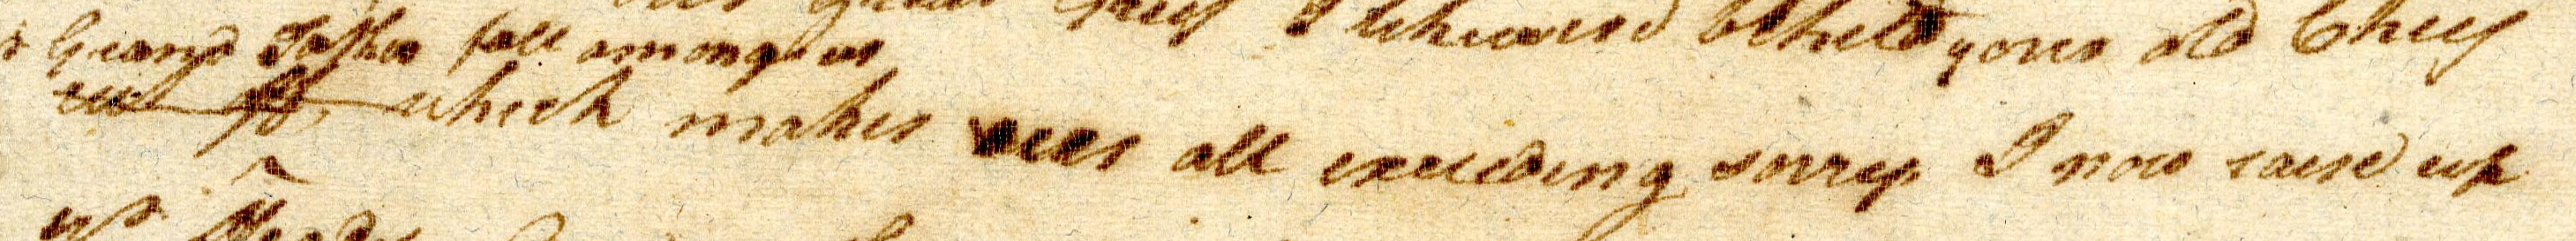cut off, which makes us all exceeding sorry I now raise up
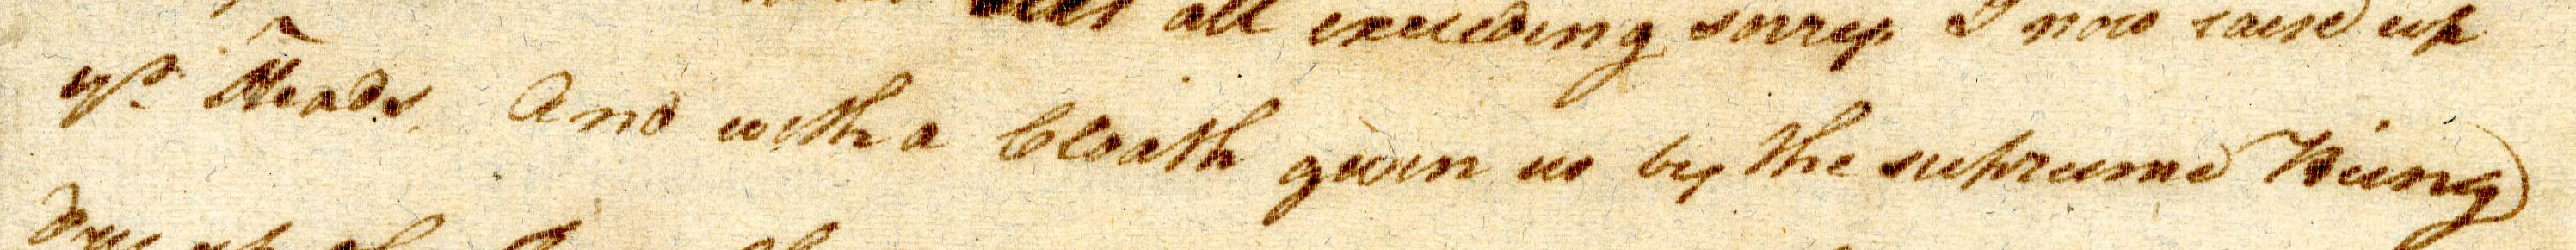y^r. Heads. And with a Cloath given us by the supreme Being
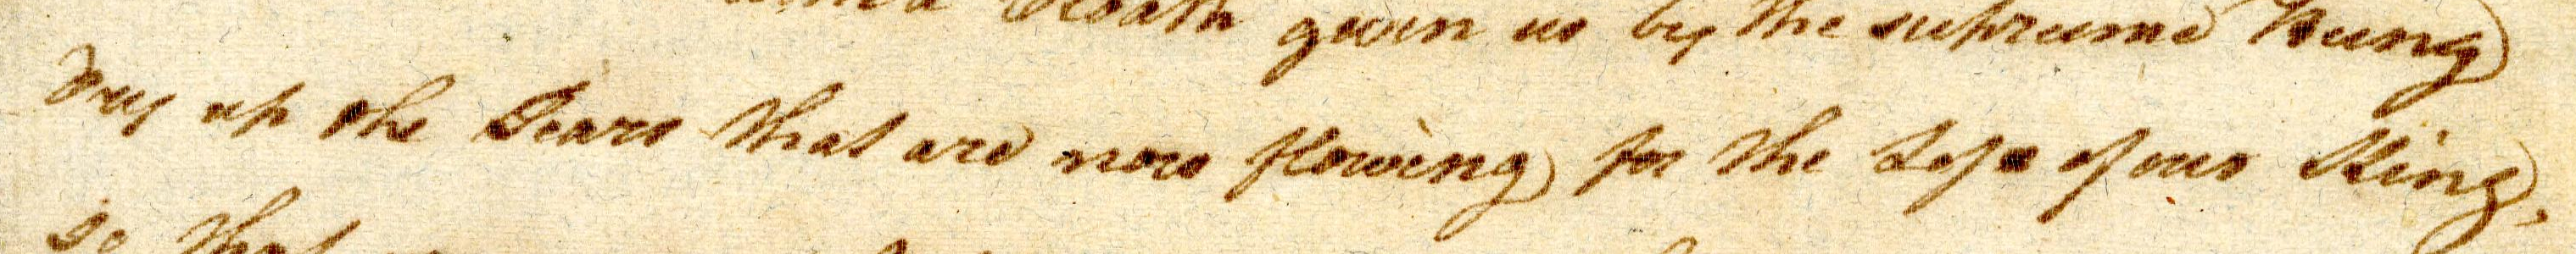dry up the Tears that are now flowing for the Loss of our King,
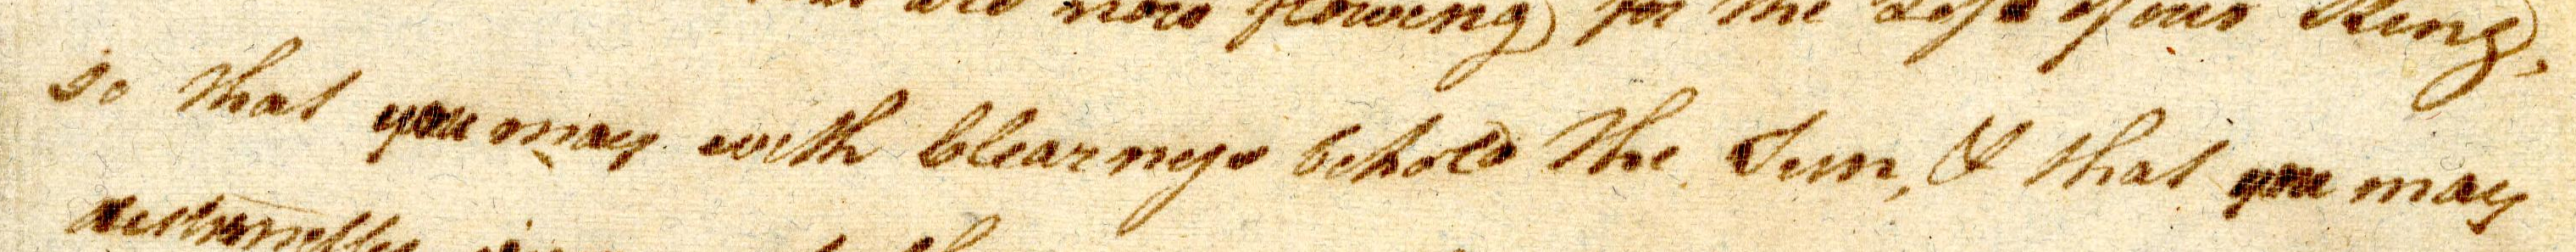so that you may with Clearness behold the Sun, & that you may
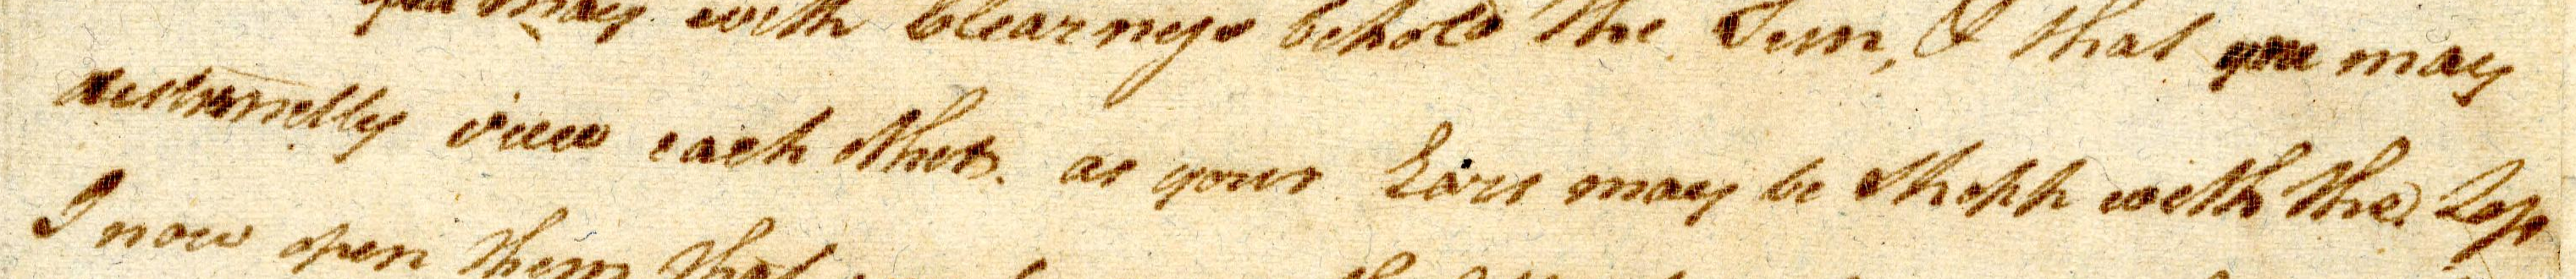externally view each other as your Ears may be stopp with the Loss
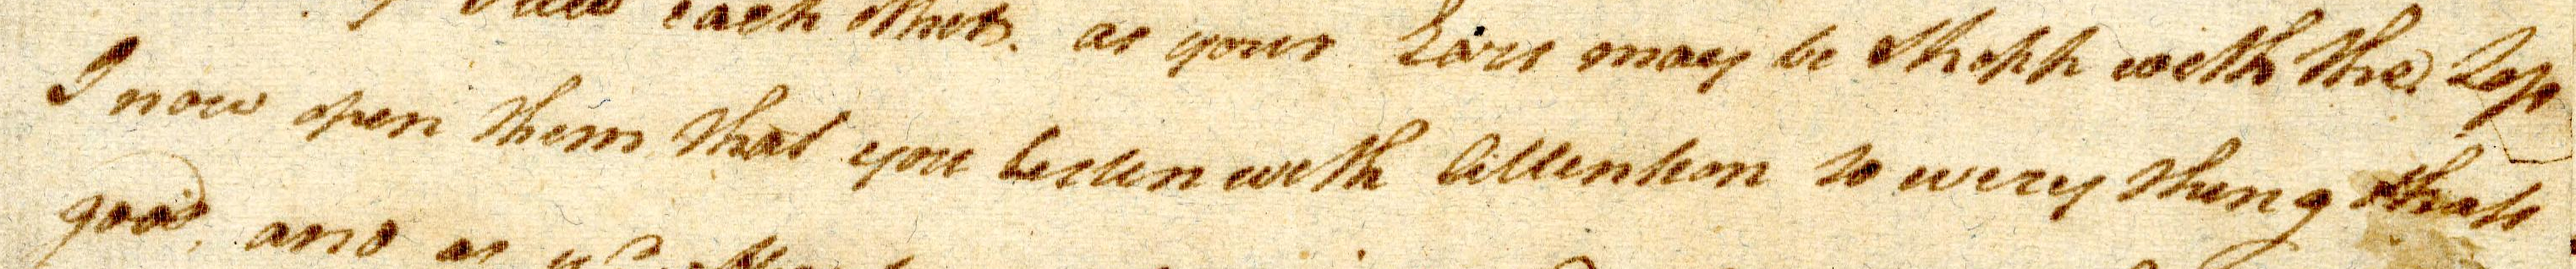I now open them that you listen with attention so every thing thats
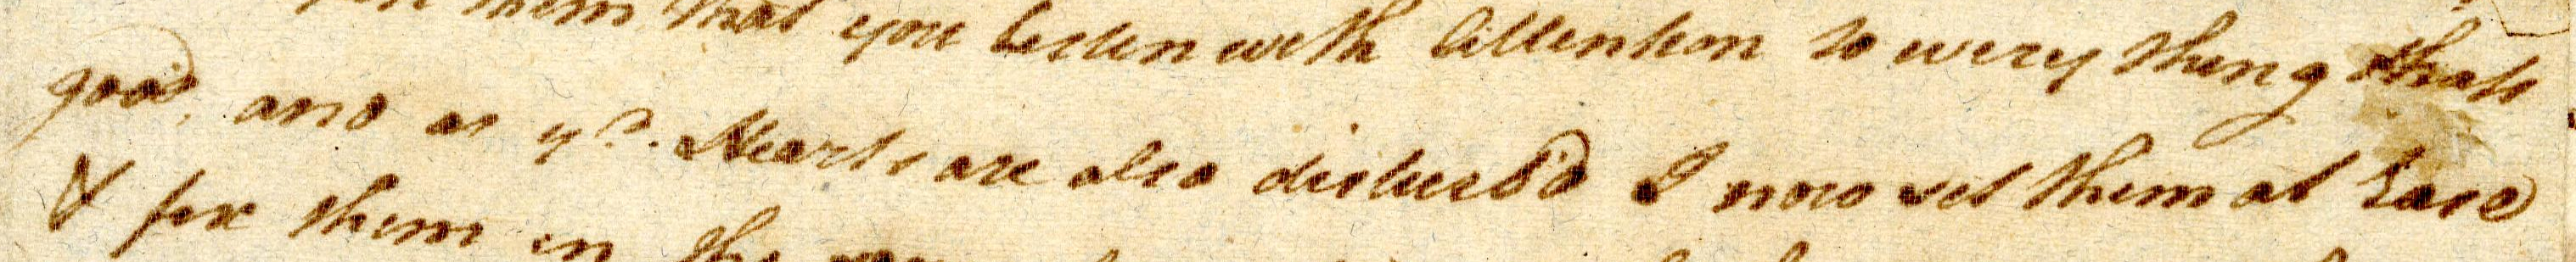good and as y^r. Hearts are also disturb'd I now set them at Ease
